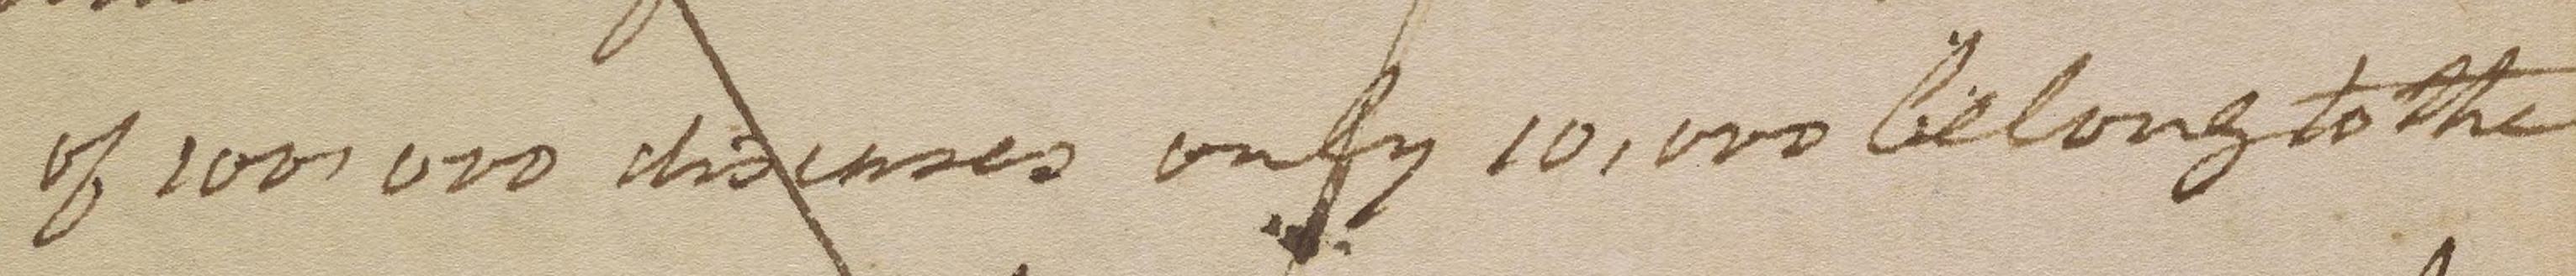of 100,000 diseases only 10,000 belong to the
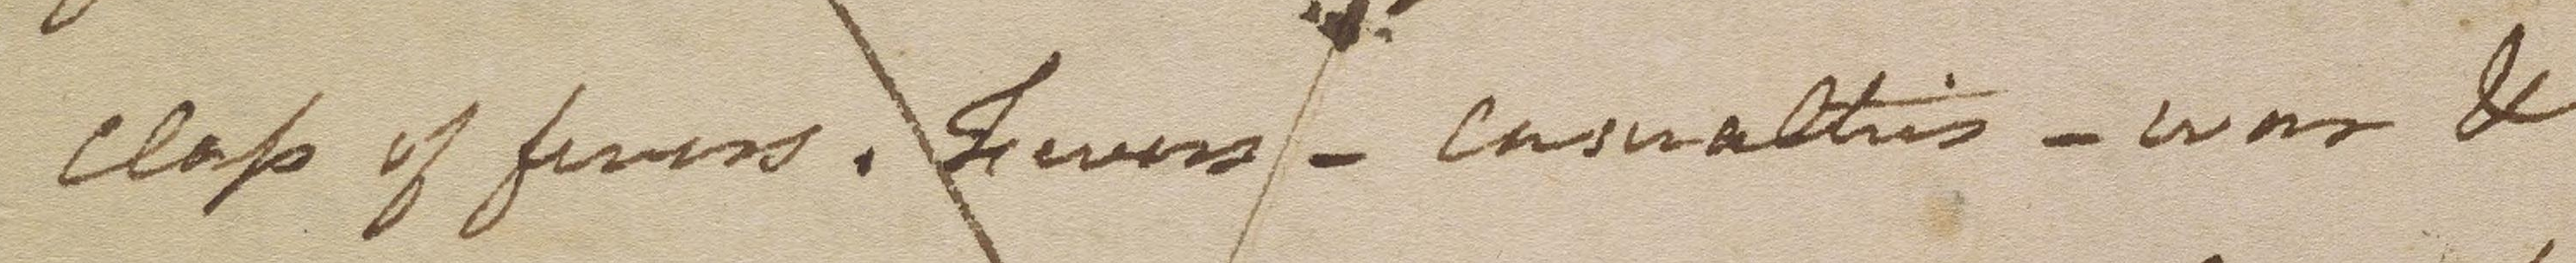class of fevers. Fevers- casualties- war &
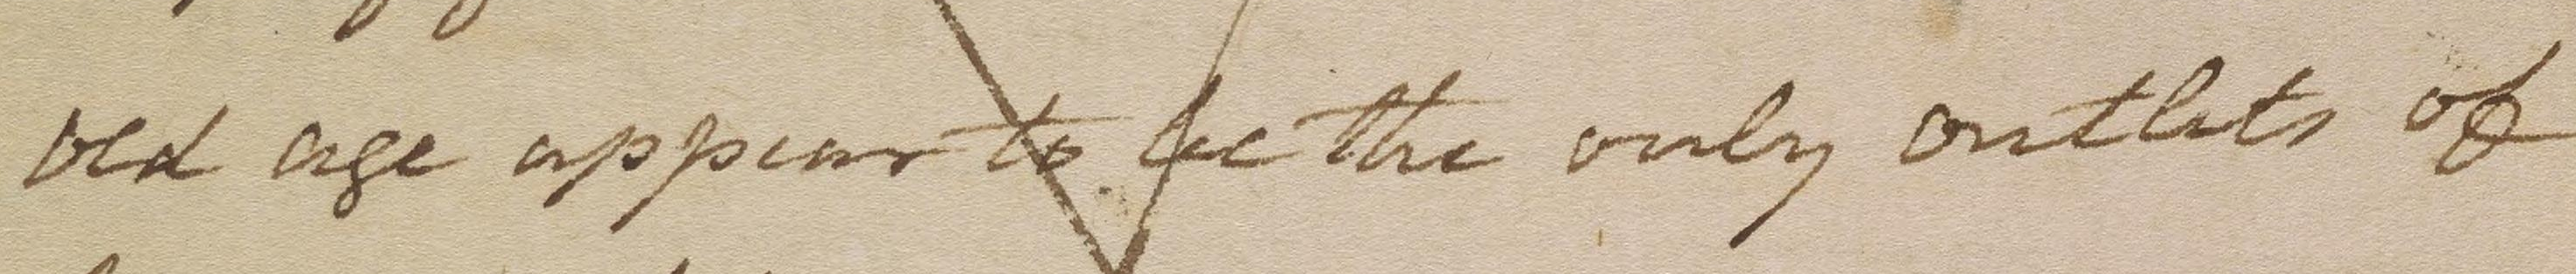old age appear to be the only outlets
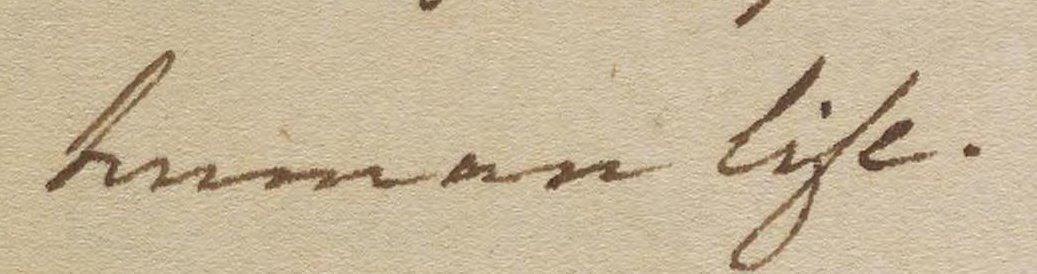human life.
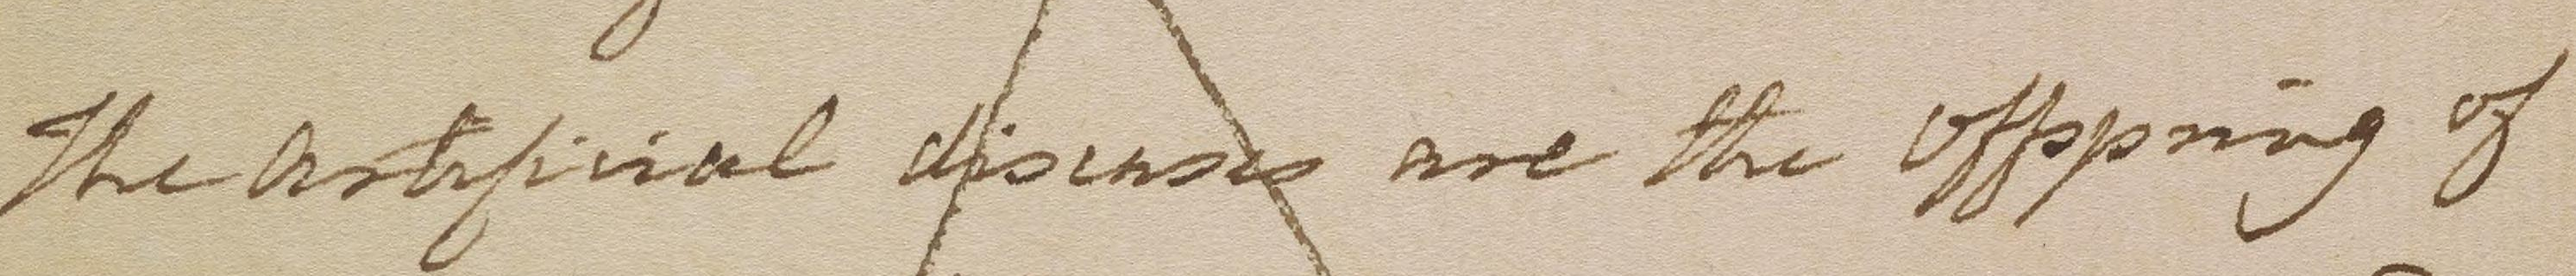The artificial disease are the offspring of
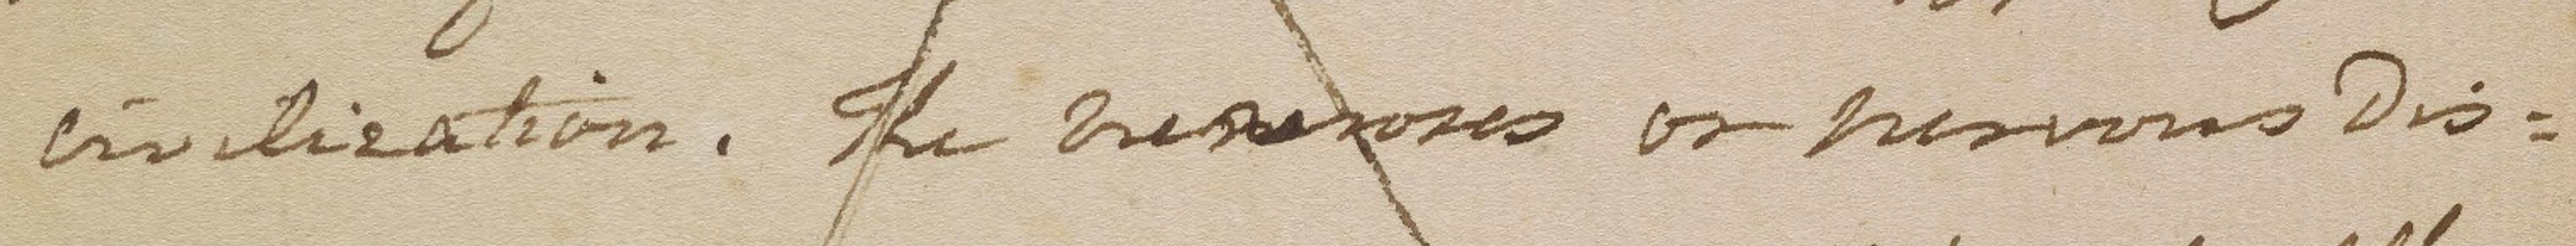civilization. The neuroses or nervous dis-
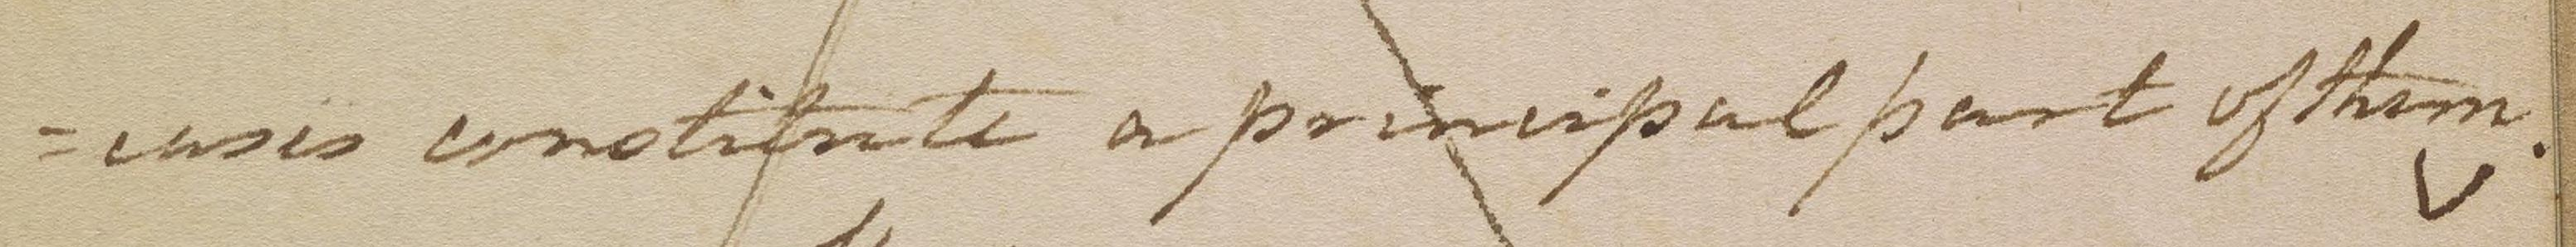eases constitute a principal part of them.
